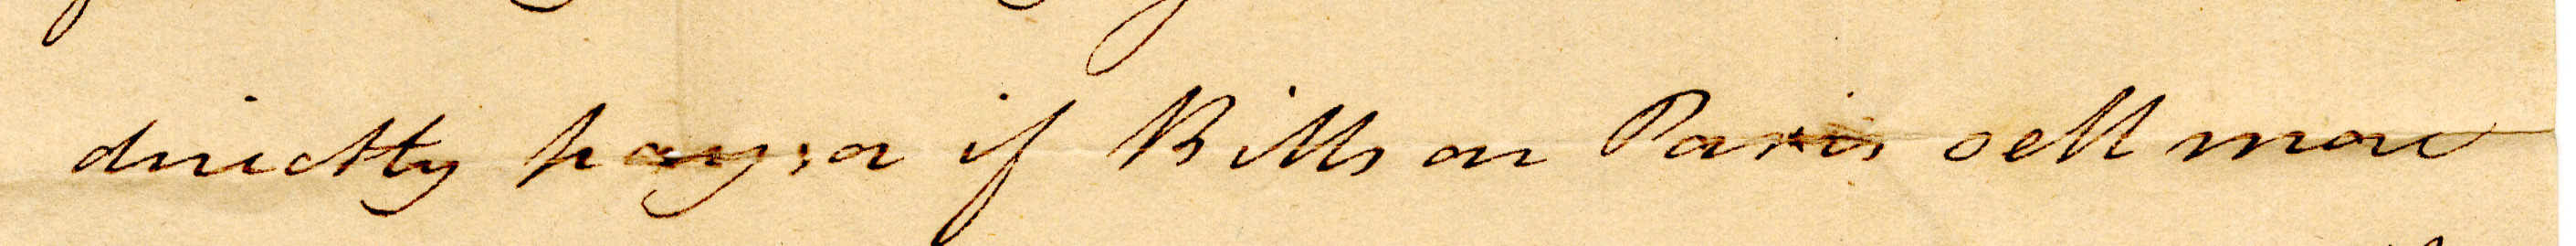directly pay, or if Bills on Paris sell more
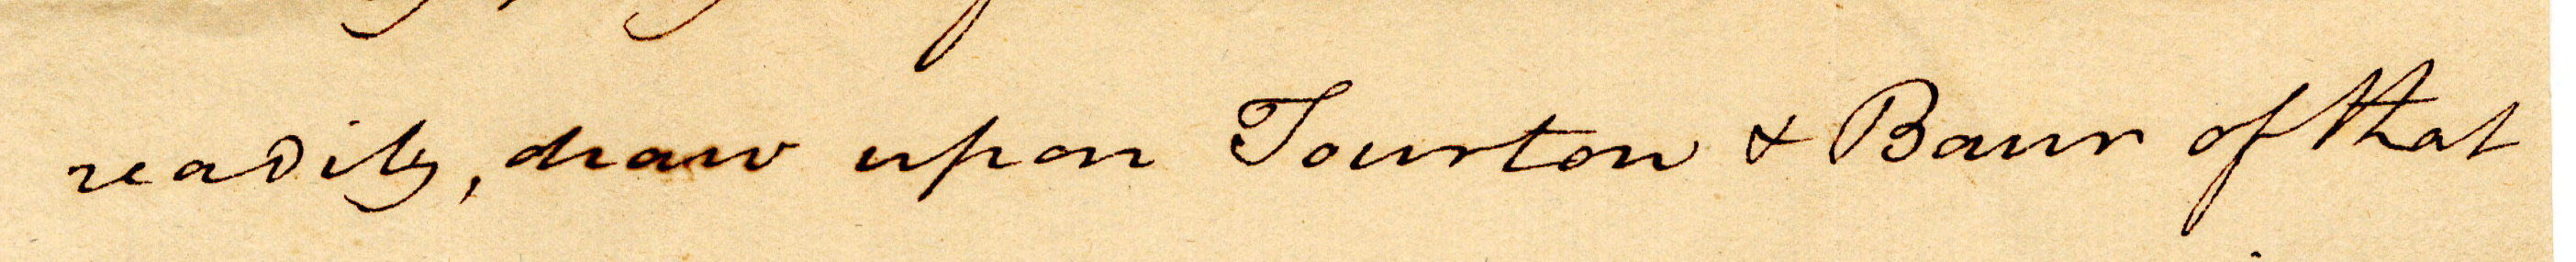readily, draw upon Tourton & Baur of that
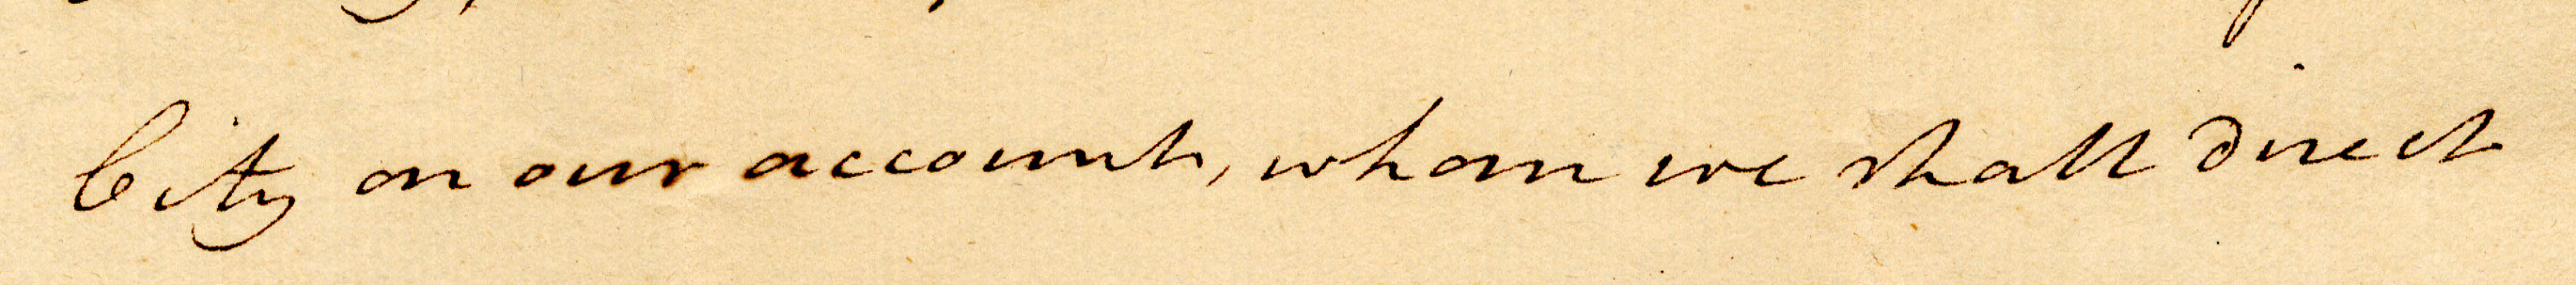City on our accounts, whom we shall direct
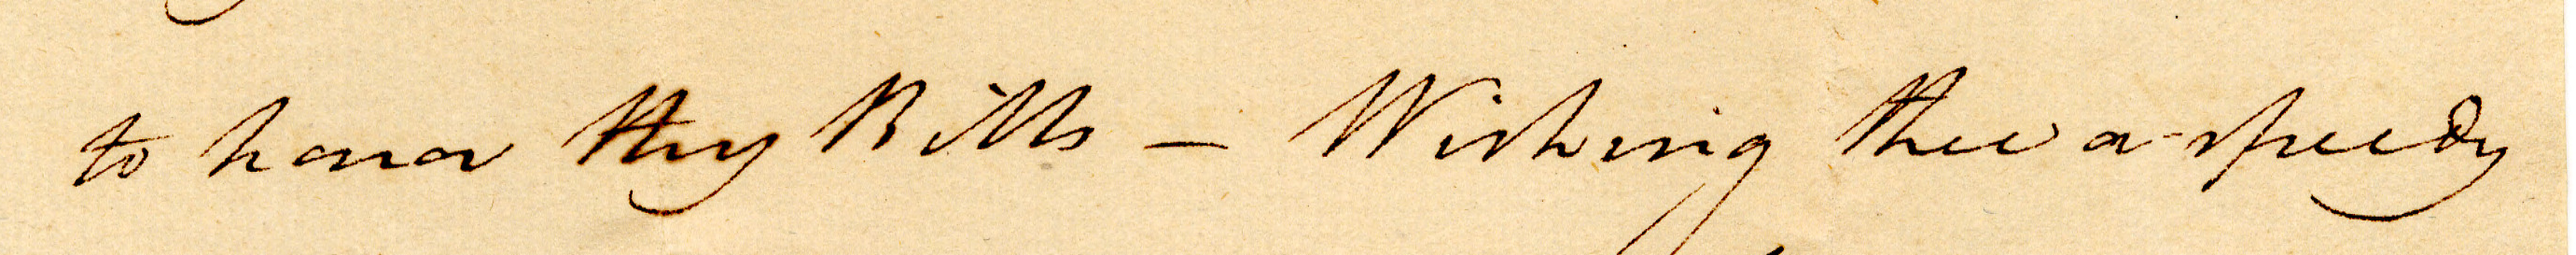to honor thy Bills- Wishing thee a speedy
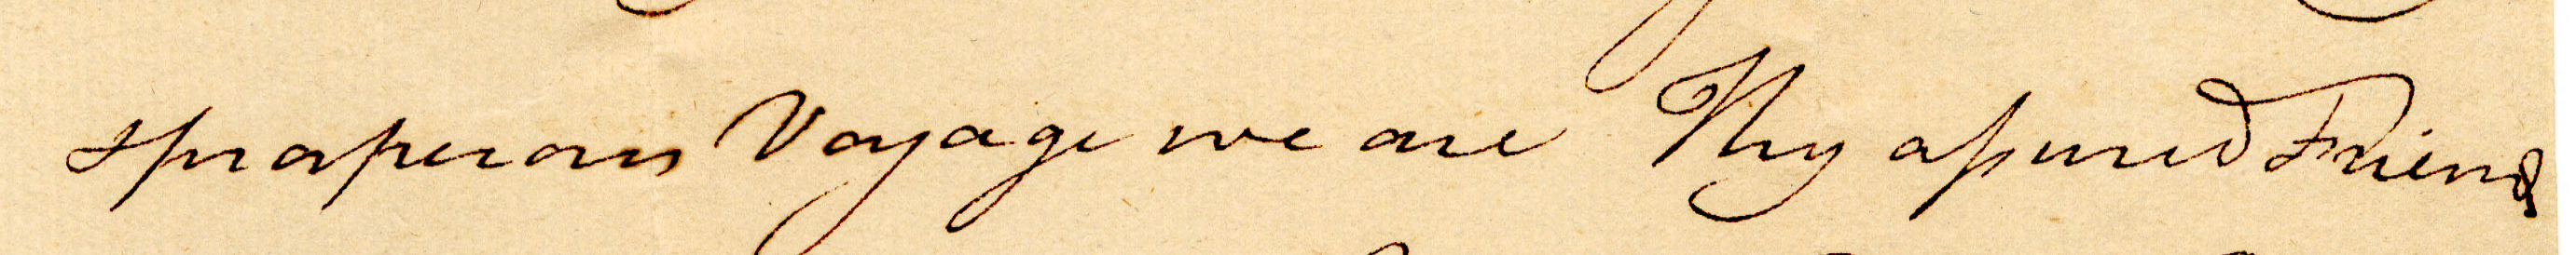& prosperous Voyage we are Thy assured Friends
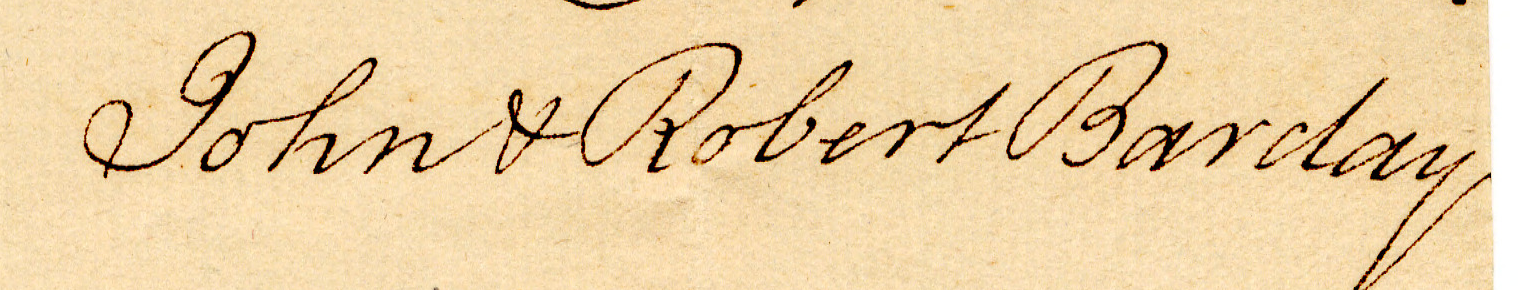John & Robert Barclay
